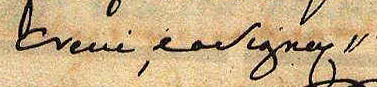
creui, e aSigney //
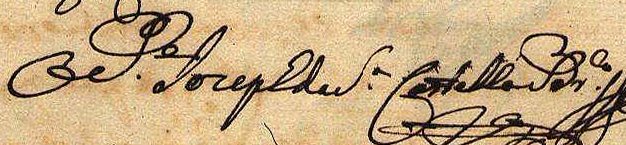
O P.e Iozeph da S.a Castello Br.co
